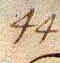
44
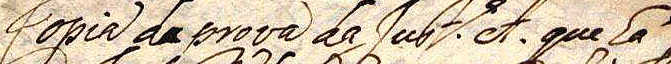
Copia da prova da Just.a A. que há
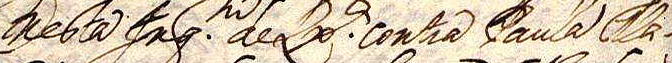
nesta Jnq.m de Lx.a contra Paula Ma
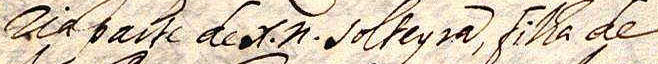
ria parte de x. n. solteyra, filha de
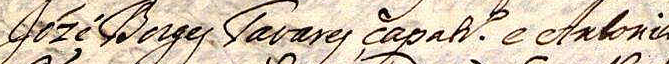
Jozé Borges Tavares çapatr.o e Antonia
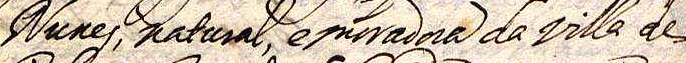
Nunes, natural, e moradora da villa de
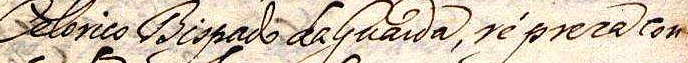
Celorico Bispado da Guarda, ré preza con
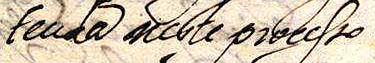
teuda neste processo.
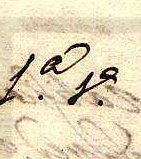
1.a t.a
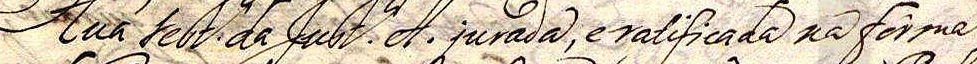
Huā test.a da Just.a A. jurada, e ratificada na forma
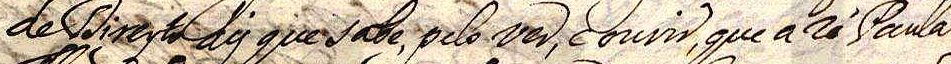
de Direyto dis que sabe, pelo ver, e ouvir, que a Ré Paula
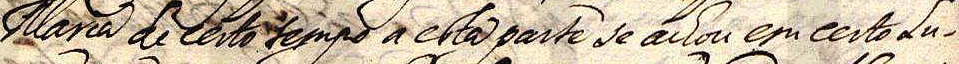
Maria de certo tempo a esta parte se achou em certo Lu
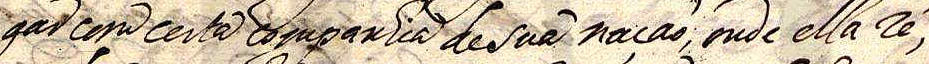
gar com certa companhia de sua naçaõ, onde ella Ré,
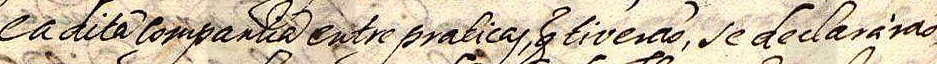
e a dita companhia entre praticas, q̄ tiveraõ, se declararaõ
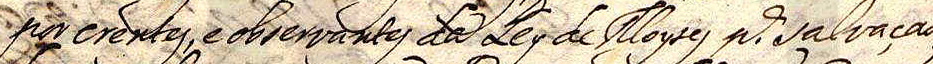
por crentes, e observantes da Ley de Moyzes, p.a salvaçaõ
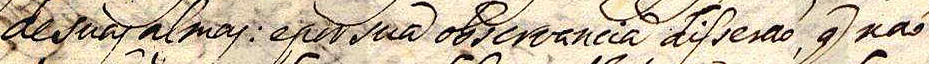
de suas almas: e por sua observancia disseraõ, q̄ naõ
